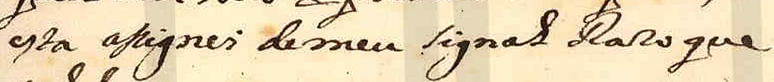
esta assignei de meu signal Razo que
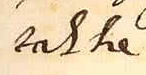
tal he
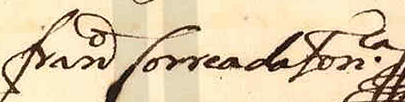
franco Correa da Fon.ca
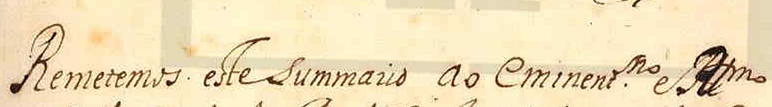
Remetemos este Summario ao Eminent.Mo e R.mo
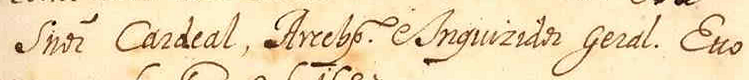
Snor̄ Cardeal, Arcebp.o e Inquizidor geral. Euo
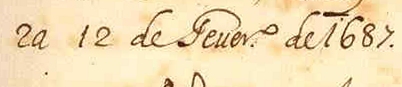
ra 12 de Feuer.o de 1687.
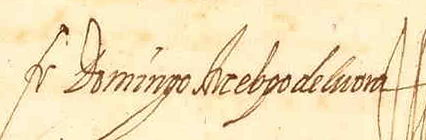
fr. Domingo Arcebpo de Euora
